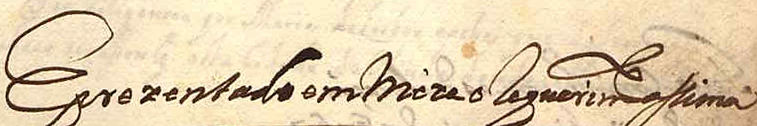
E prezentado em meza o Requerimto assima
